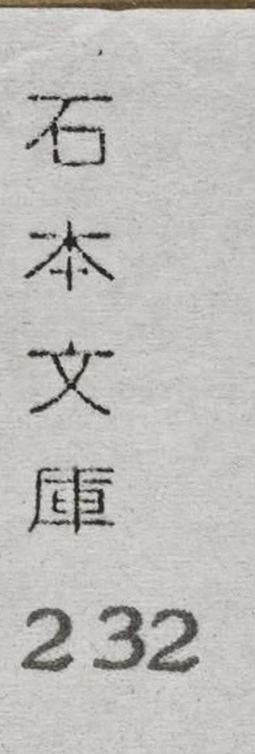石本文庫

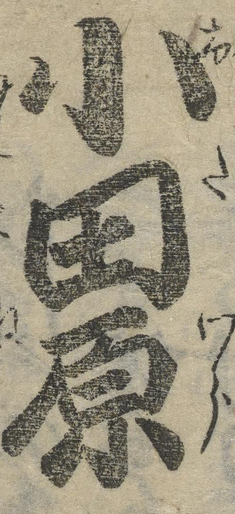小田原

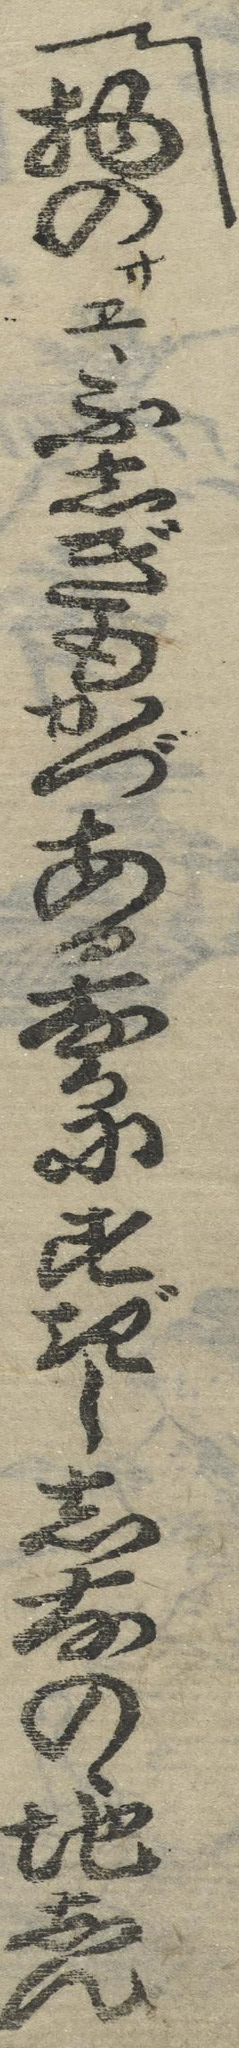〽おのサエゝふしぎもかづあるなかにすぎししなのゝ地しん
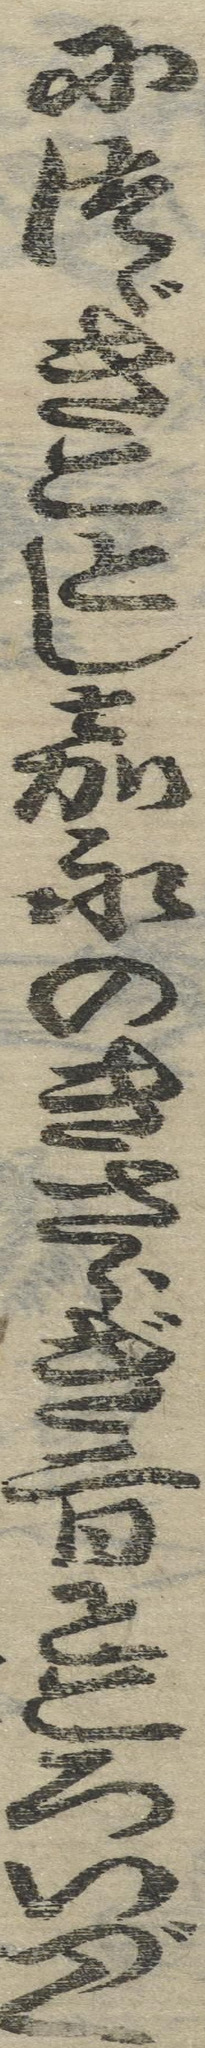につゞきことし嘉永のきさらぎ二日ところいづく
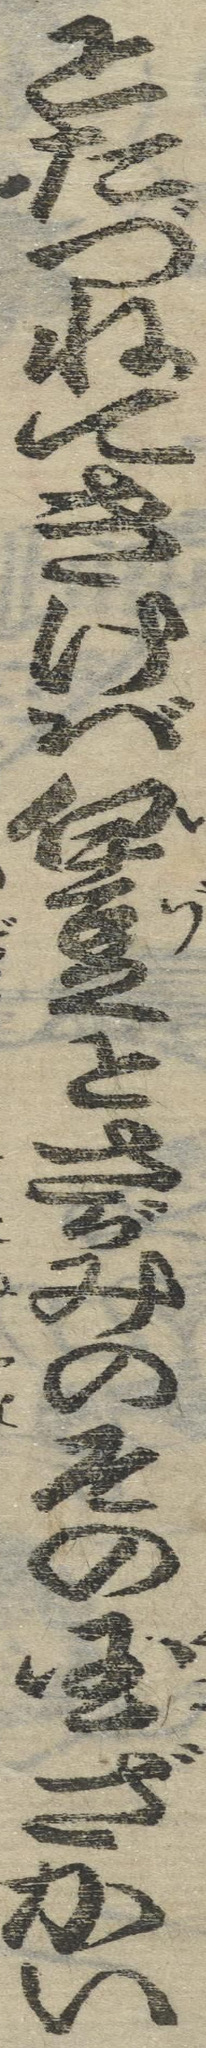とたづねてきけば伊豆とさがみのその国ざかい
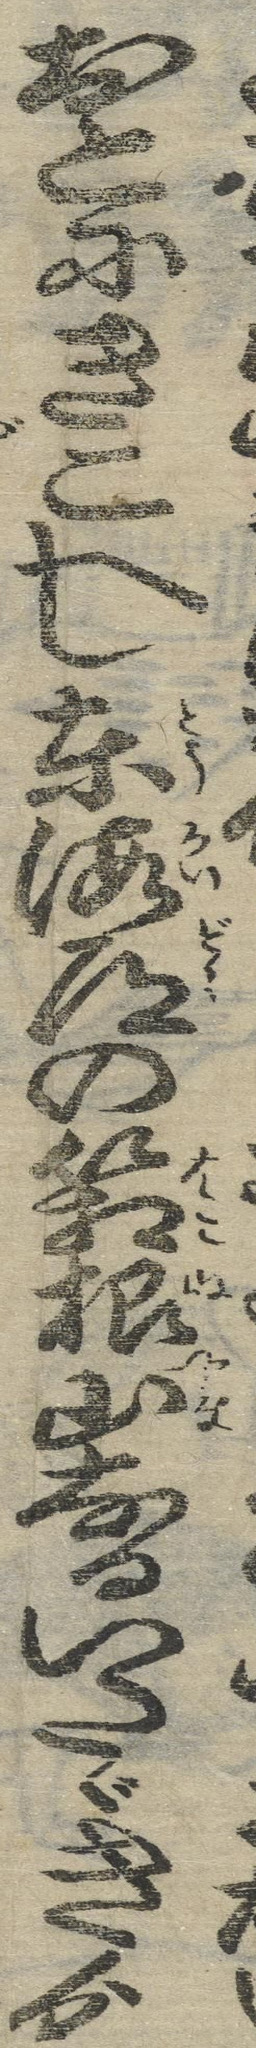おのにきこへし東海道の箱根山なるいたゞきゟ
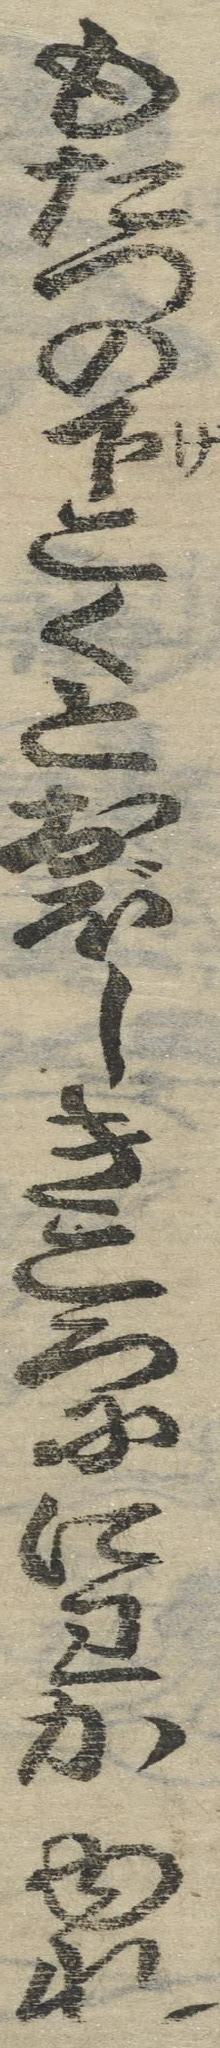もたつの下こくとおぼしきころににわかゆれ
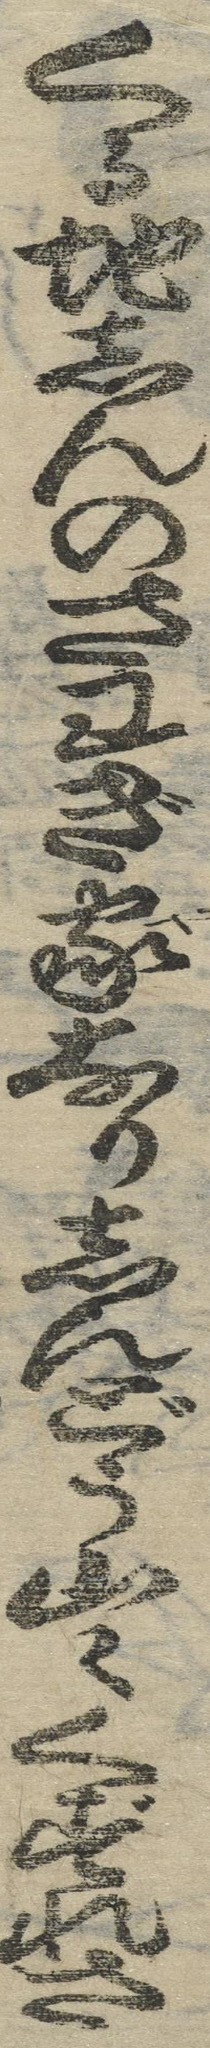くる地しんのさわぎ家なりしんどう山ゝくずれさ
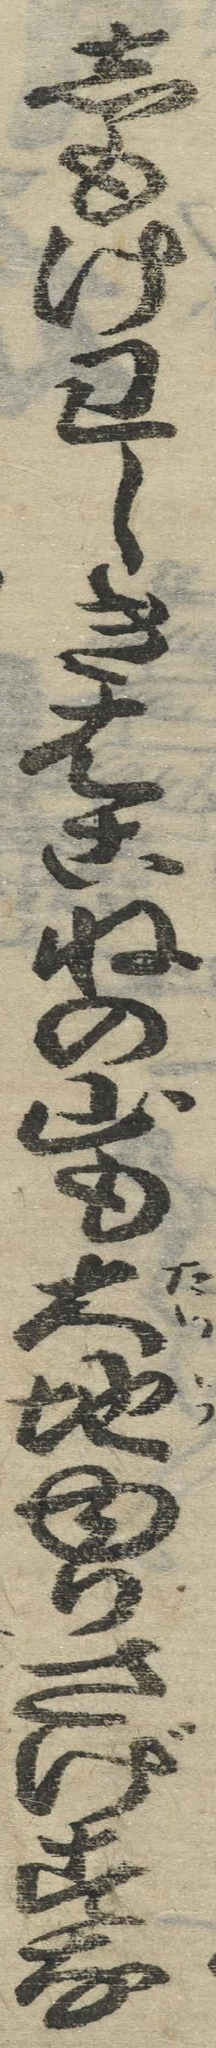しもけわしきはこねの山も大地ゆりさげすな
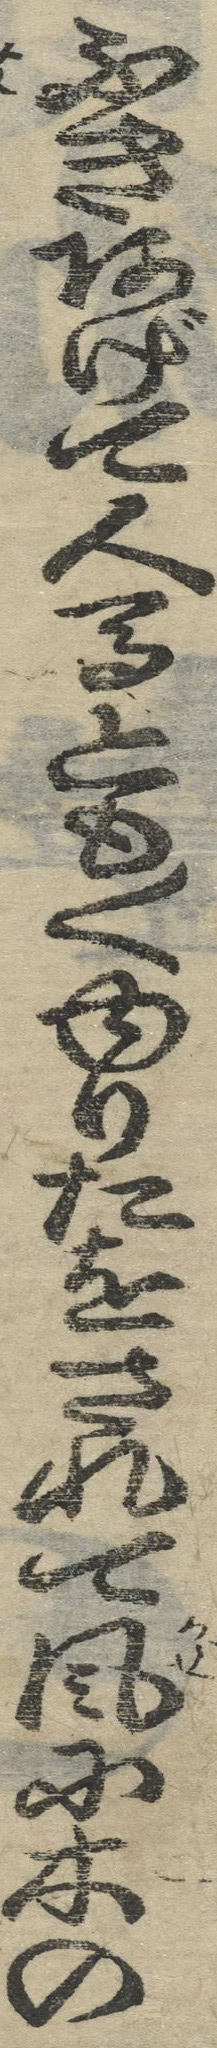ふきあげて人馬とも〳〵ゆりたをされて風に木の
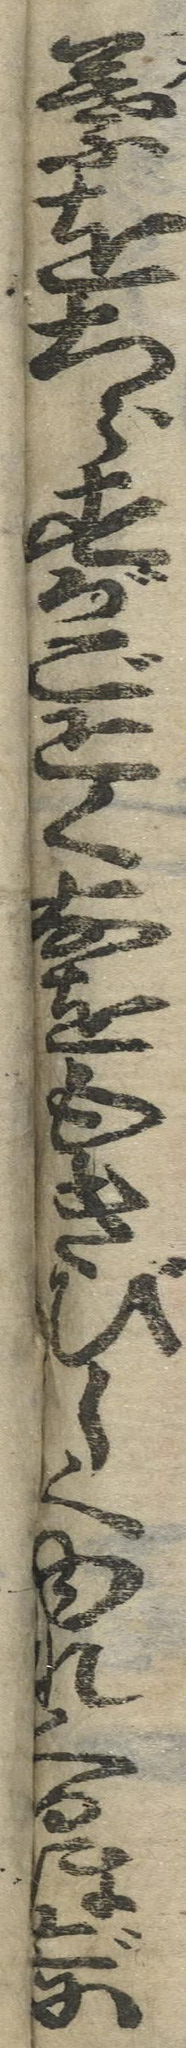葉をちらすがごとくなをもきびしくゆれくるほどに
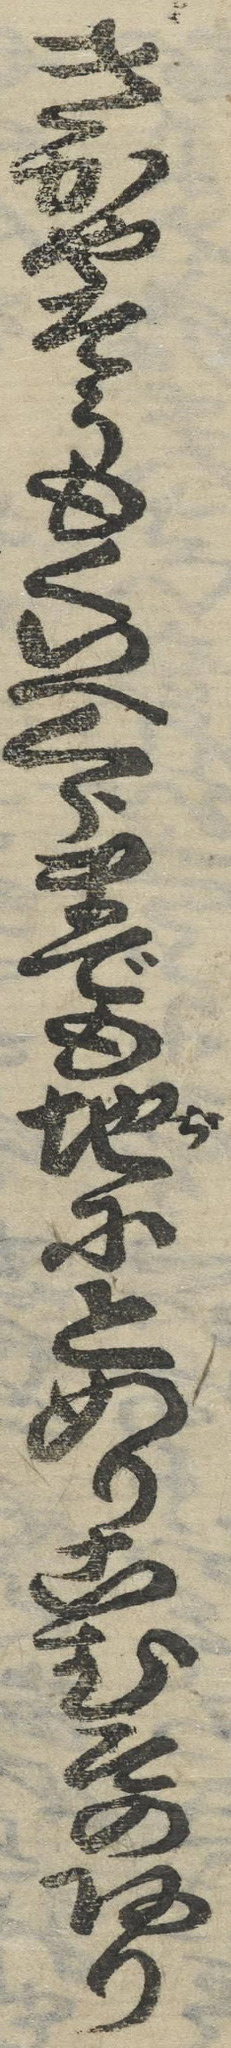きかやそくもくいへくらまでも地にとめりこむそのあり
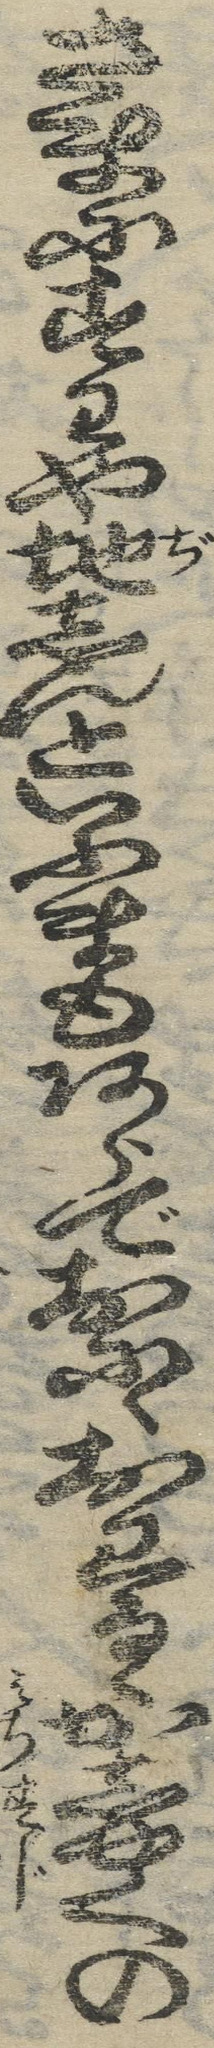さまにすわは地しんといふまもあらでおにゝおわるゝかしやくの
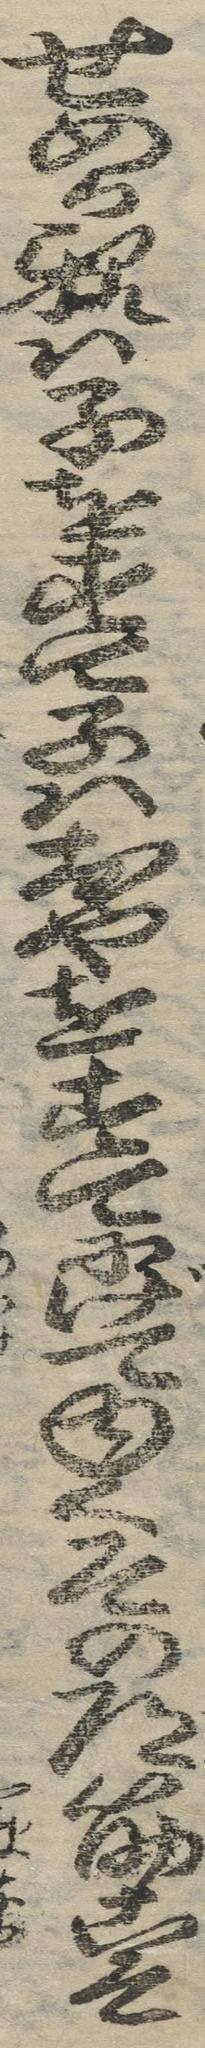せめか親は子をすて子はおやをすてにげてゆくその道筋こそ
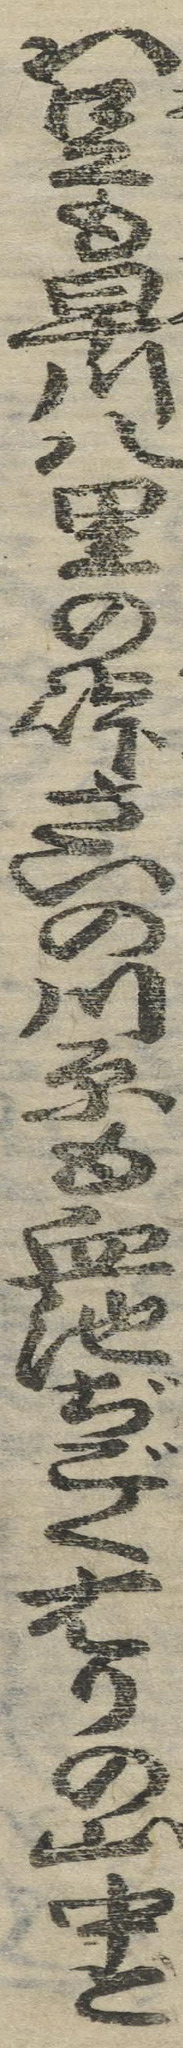は足も早川八里の峠さいの川原も血池ぢごくはりの山中ご
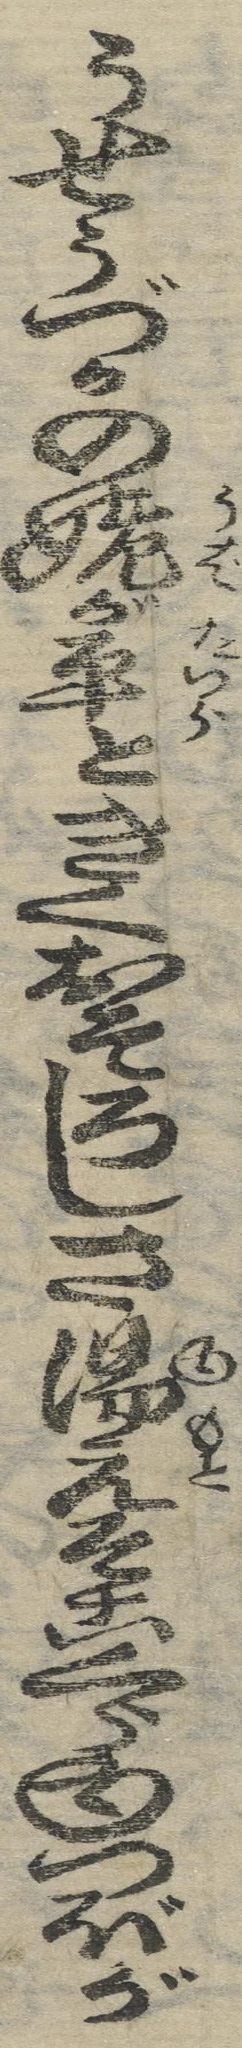うせうづかの姥が平ときくおそろしさ湯元そこくらゆつほが
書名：相州小田原箱根地震くどき
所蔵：東京大学地震研究所図書室 Earthquake Research Institute Library, The University of Tokyo, JAPAN
